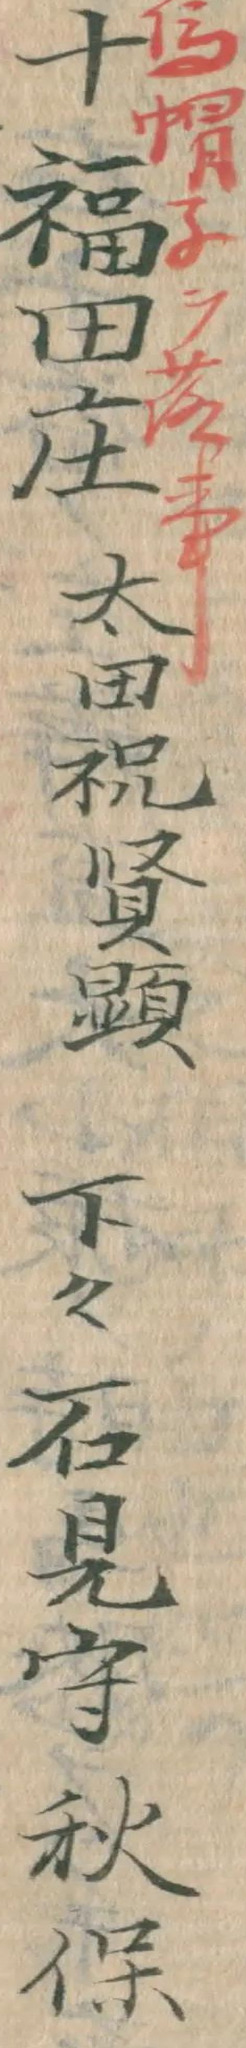十福田庄太田祝賢顕下々石見守秋保

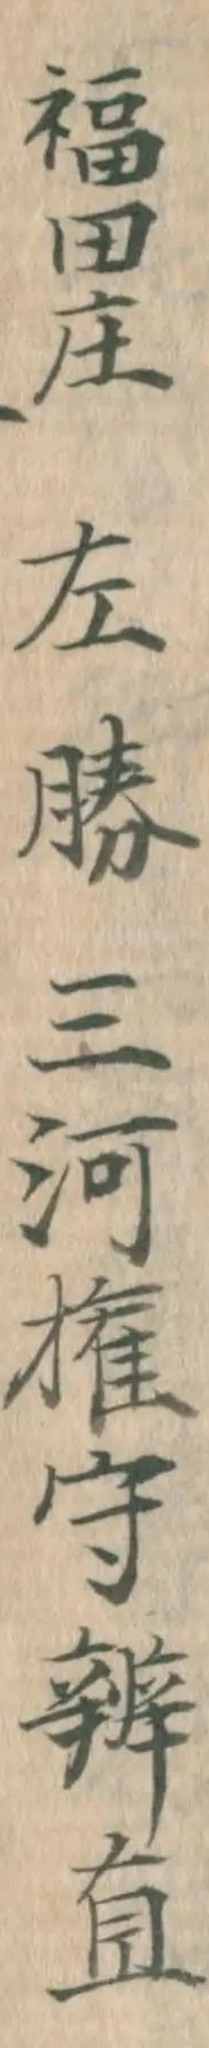福田庄左勝三河権守弁直
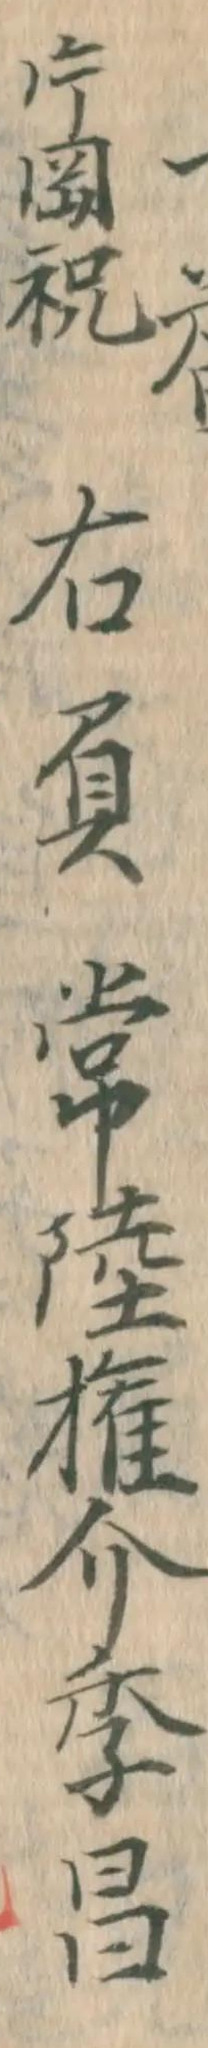片岡祝右負常陸権介季昌
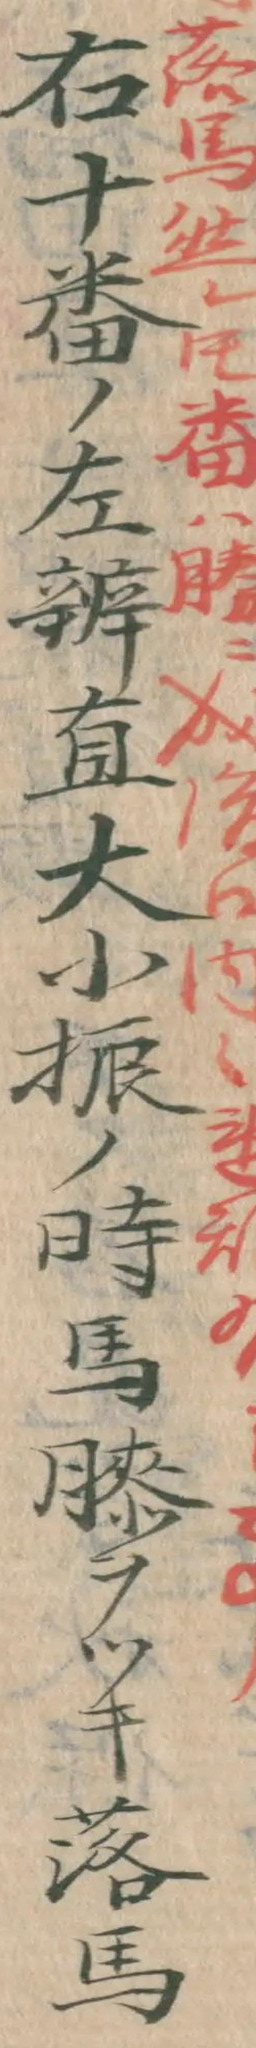右十番ノ左弁直大小振ノ時馬膝ヲツキ落馬
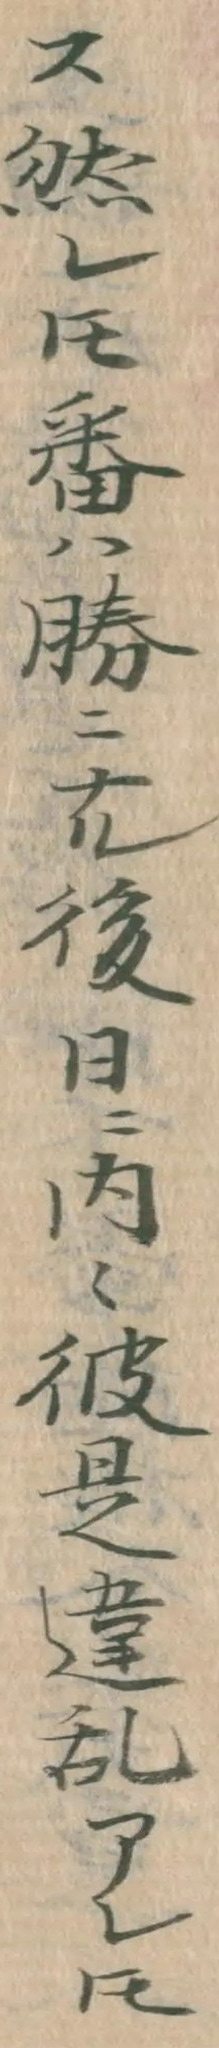ス然レトモ番ハ勝ニナル後日ニ内々彼是違乱アレトモ
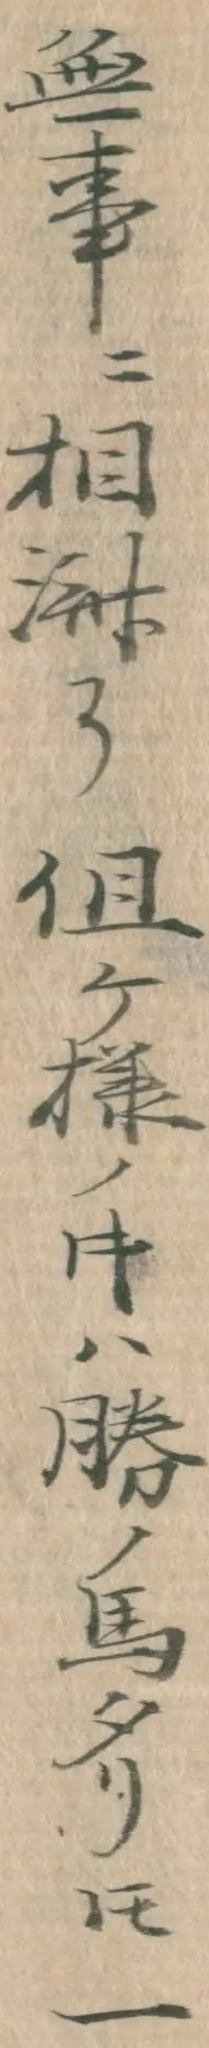無事ニ相済了但ケ様ノ中ハ勝ノ馬タリトモ一
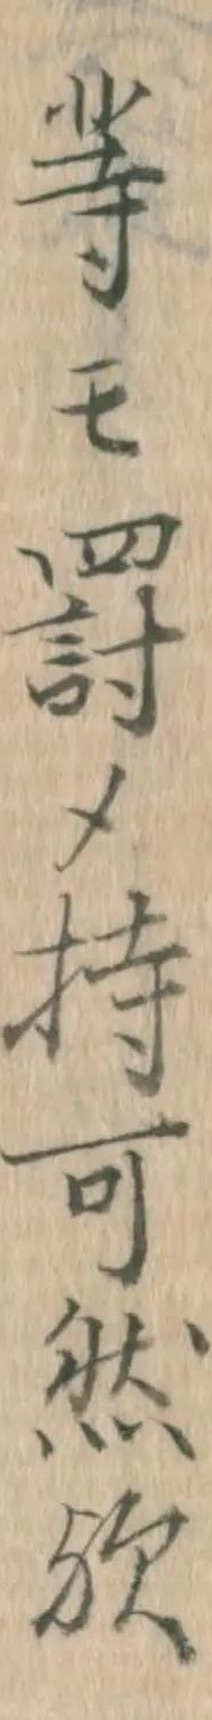等モ罰シテ持可然歟
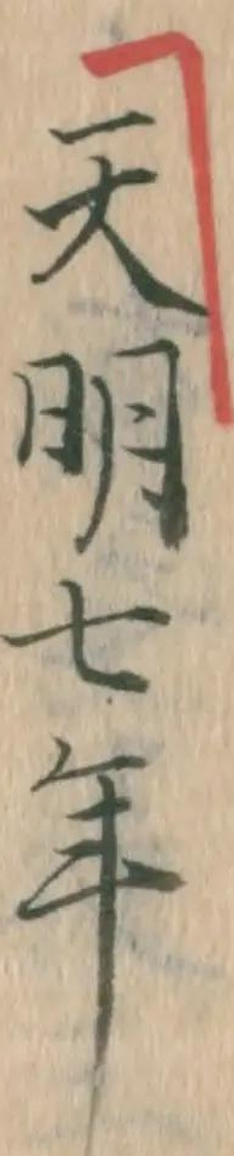天明七年
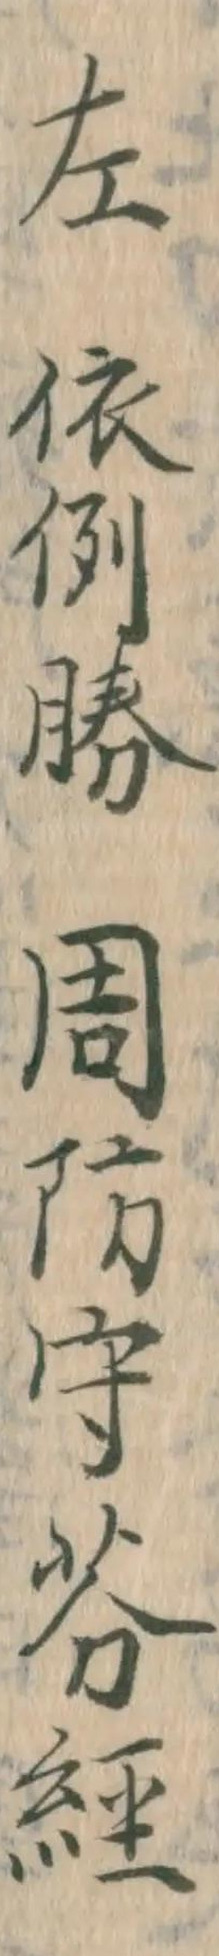左依例勝周防守芬経
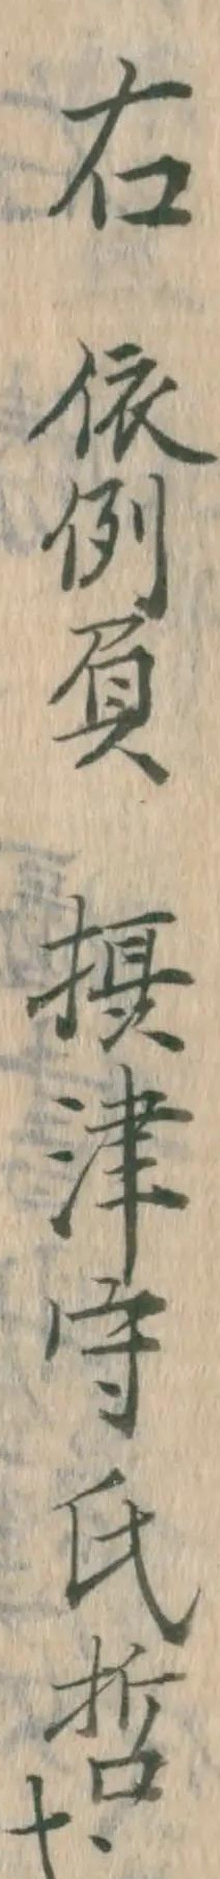右依例負摂津守氏哲
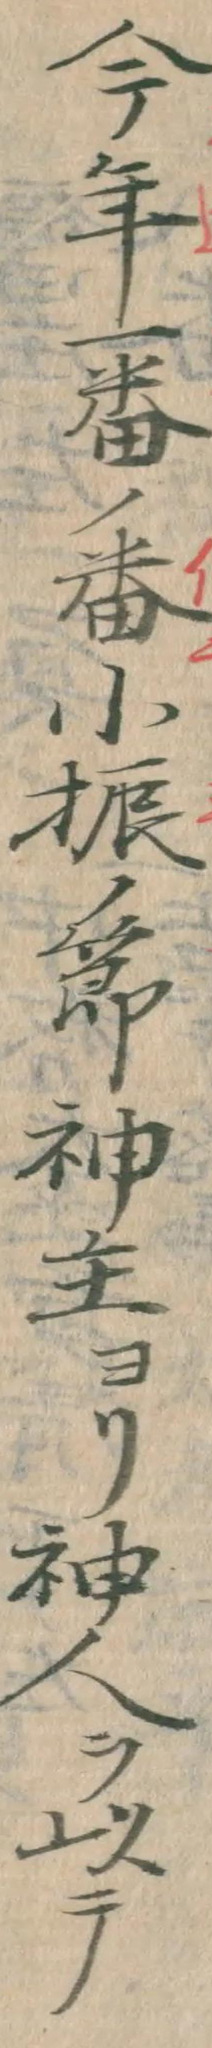今年一番ノ番小振ノ節神主ヨリ神人ヲ以テ
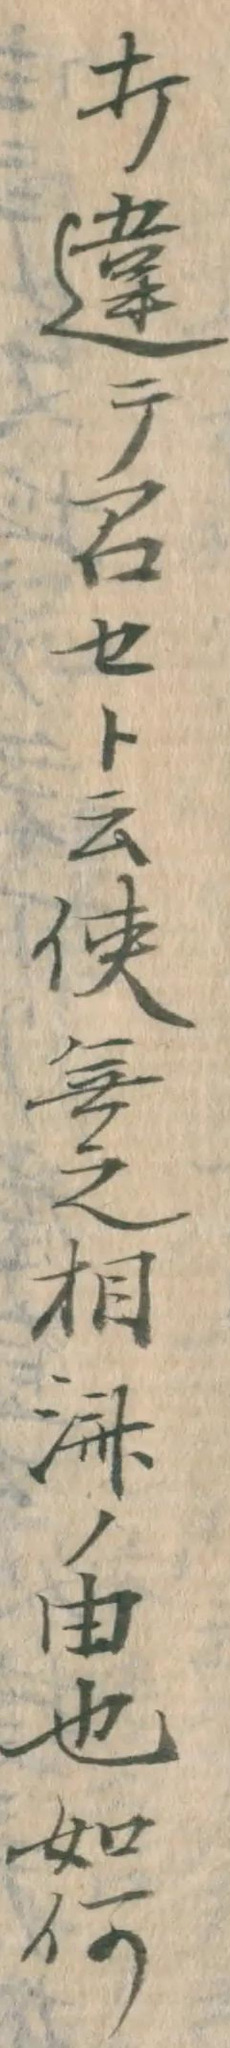打違テ召セト云使無之相済ノ由也如何
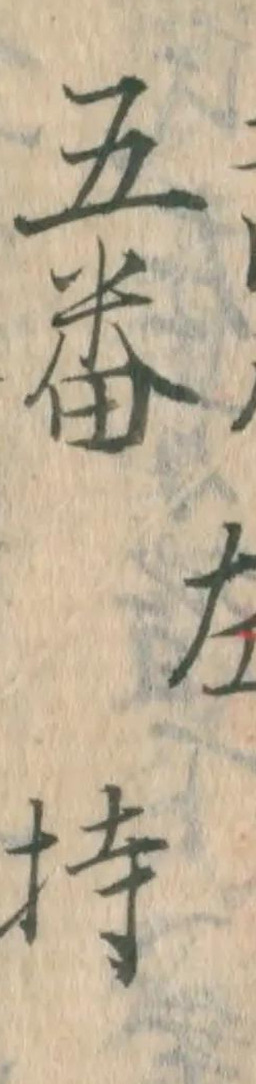五番持
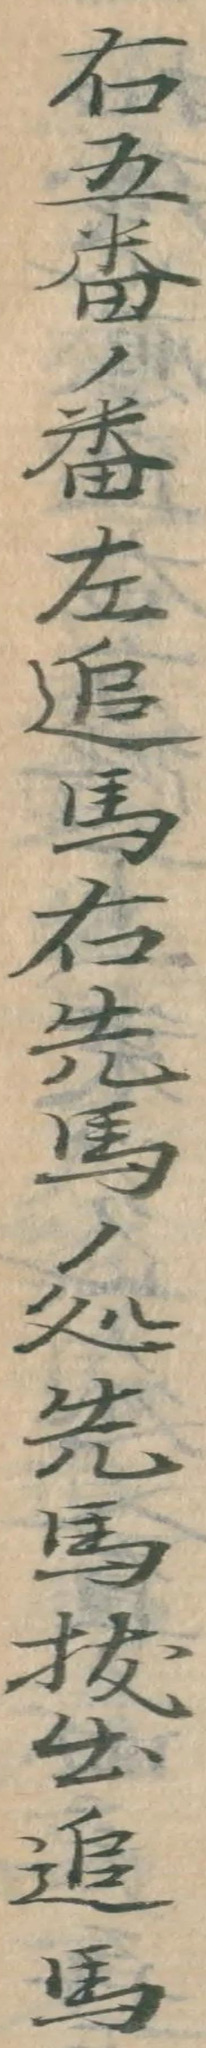右五番ノ番左追馬右先馬ノ処先馬抜出追馬

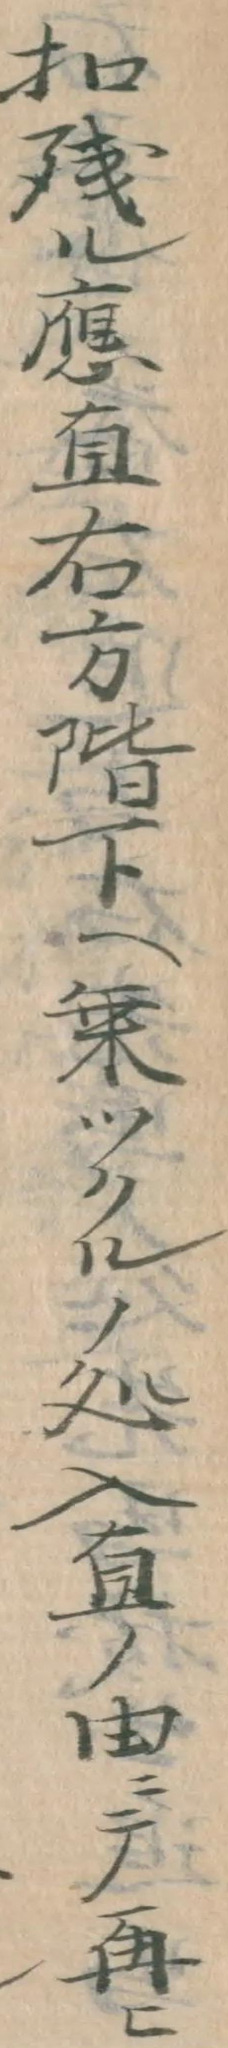扣残ル応直右方階下ヘ乗ツクルノ処入直ノ由ニテ再ヒ
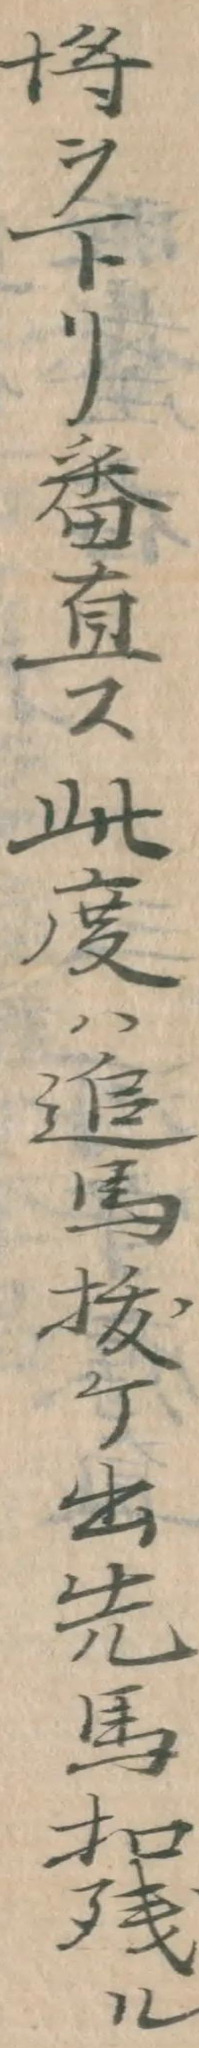埒ヲ下リ番直ス此度ハ追馬抜ケ出先馬扣残ル
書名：賀茂社記録. 第10冊
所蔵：国立国会図書館 National Diet Library, JAPAN
